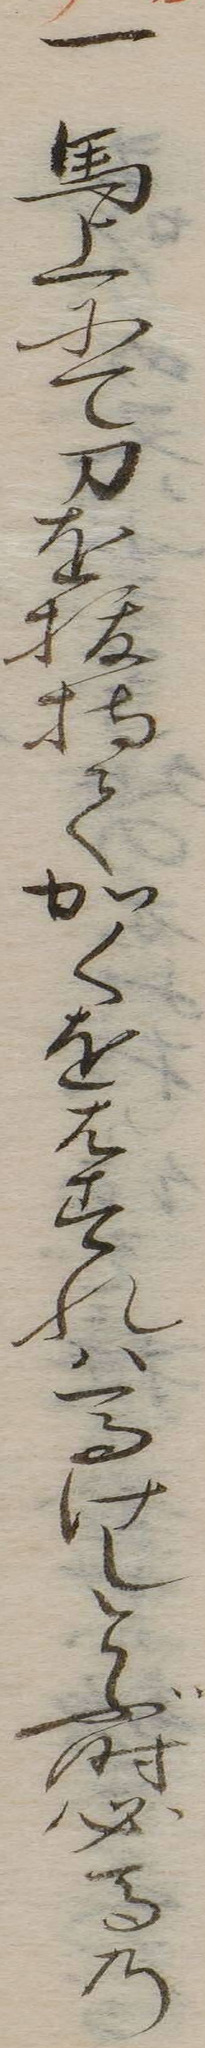一馬上にて刀を抜持てかくをはすれは馬けしとぶ時必馬の
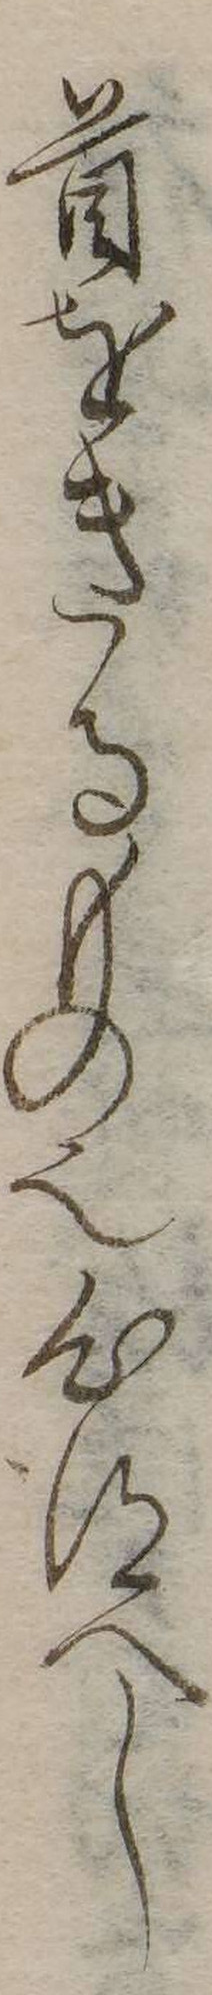首をきるもの也心すへし

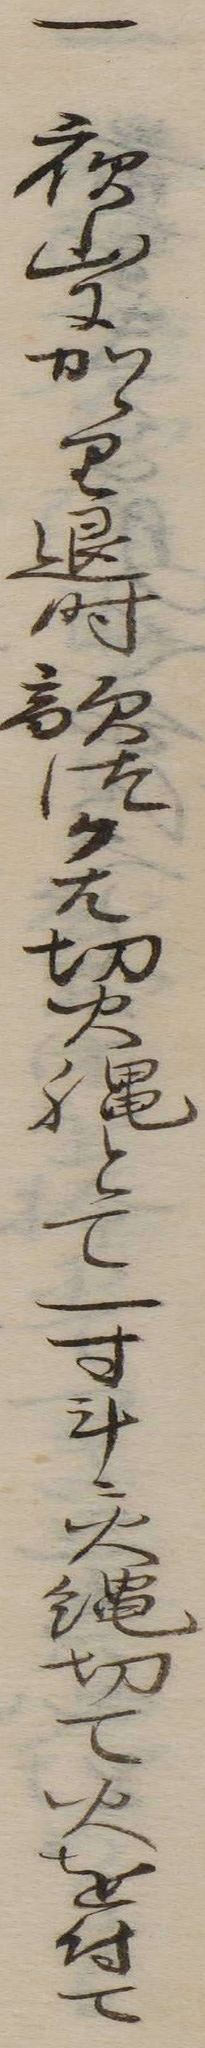一夜山にかゝり退時敵つかは切火縄とて一寸計ニ火縄切て火を付て
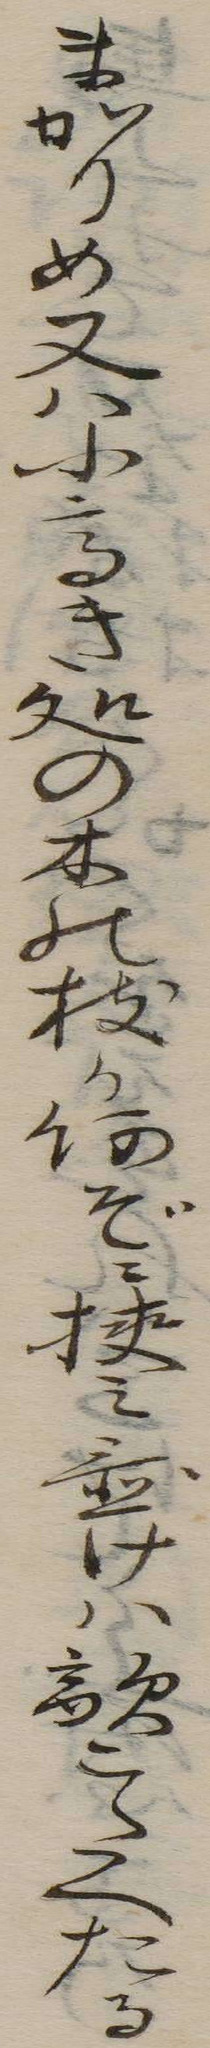まかりめ又は小高き処の木の枝か何ぞニ挟み置けは敵こたへたる
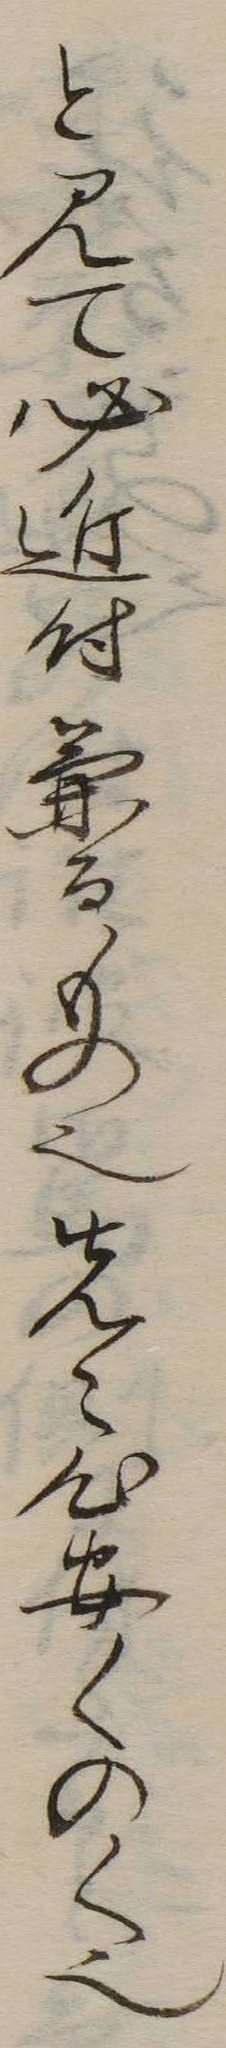と見て必近付兼るもの也先々心安くのく也
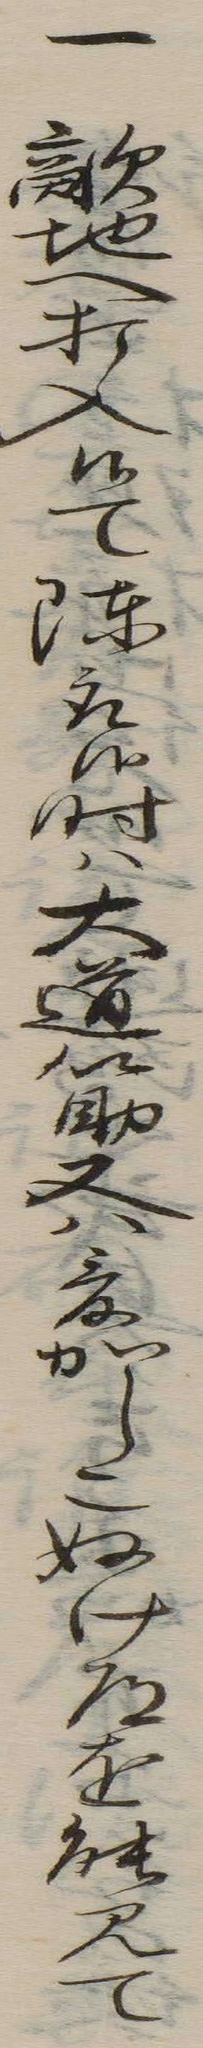一敵地へ打入候て陣取候時は大道筋又は爰かしこぬけ道を能見て
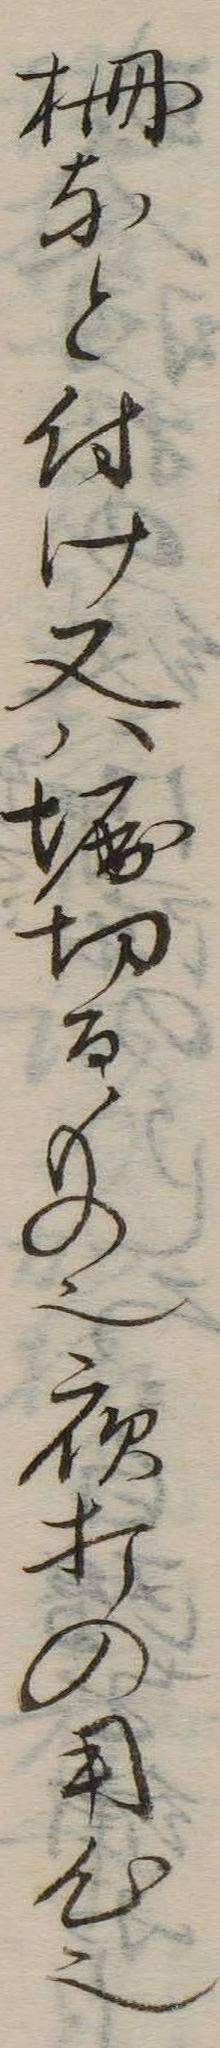柵なと付け又は堀切るもの也夜討の用心也
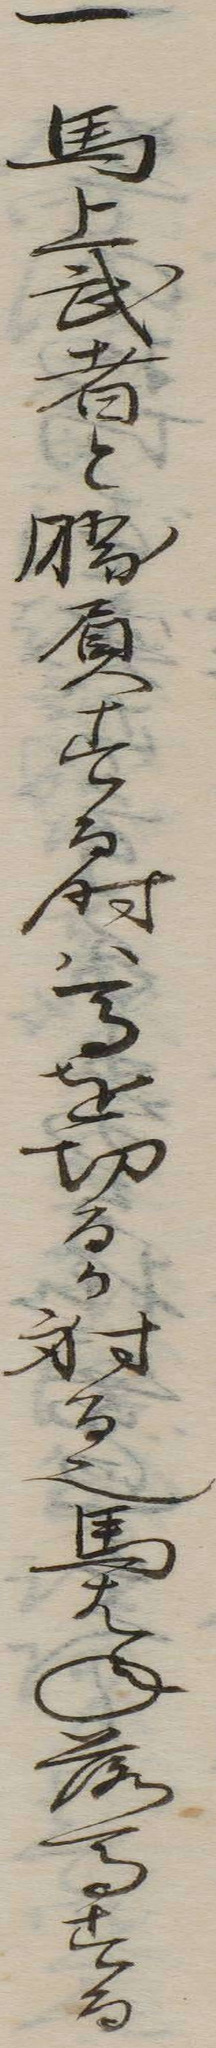一馬上武者と勝負する時は馬を切るか射る也馬はね落馬する
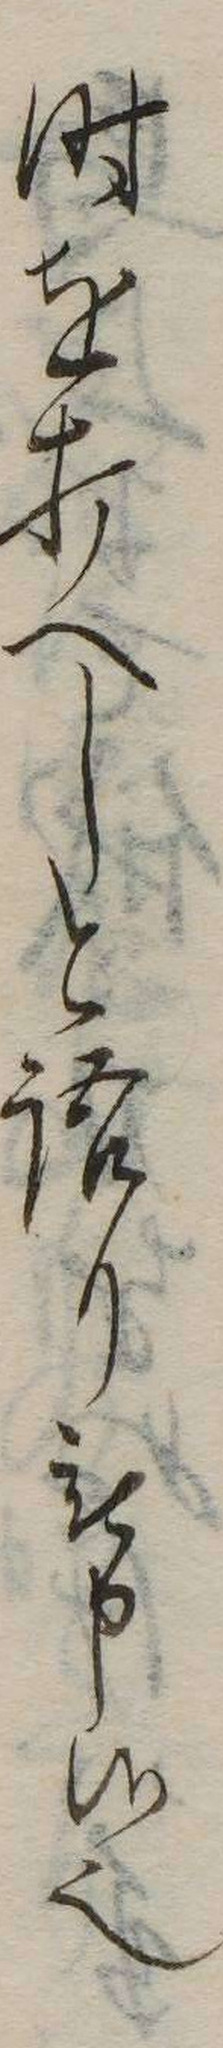時を打へしと語り被申候也
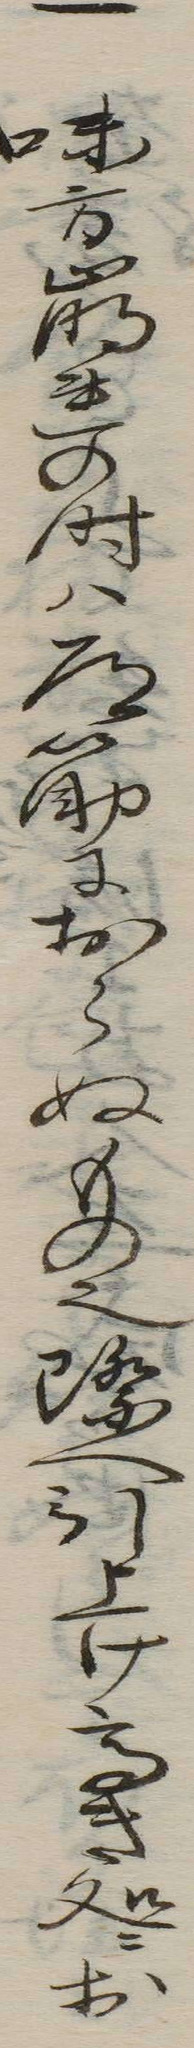一味方崩れの時は道筋におらぬもの也際へ引上げ高き処ニお
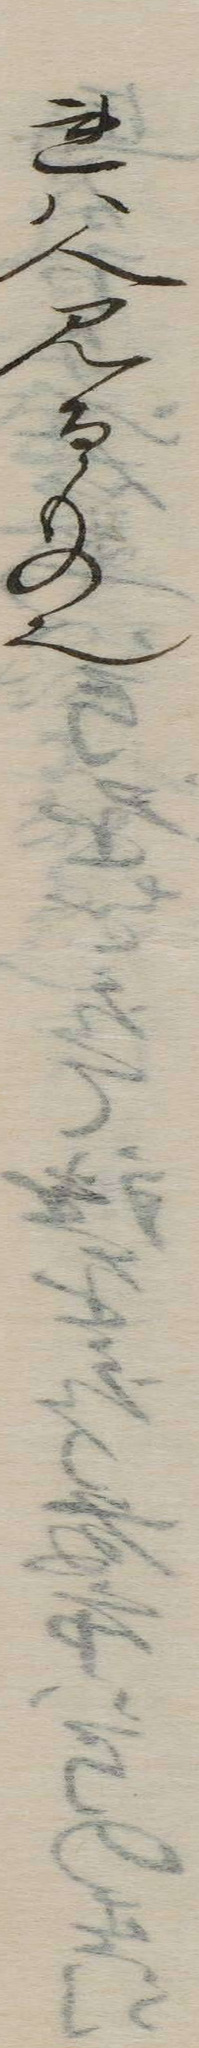れは人見るもの也
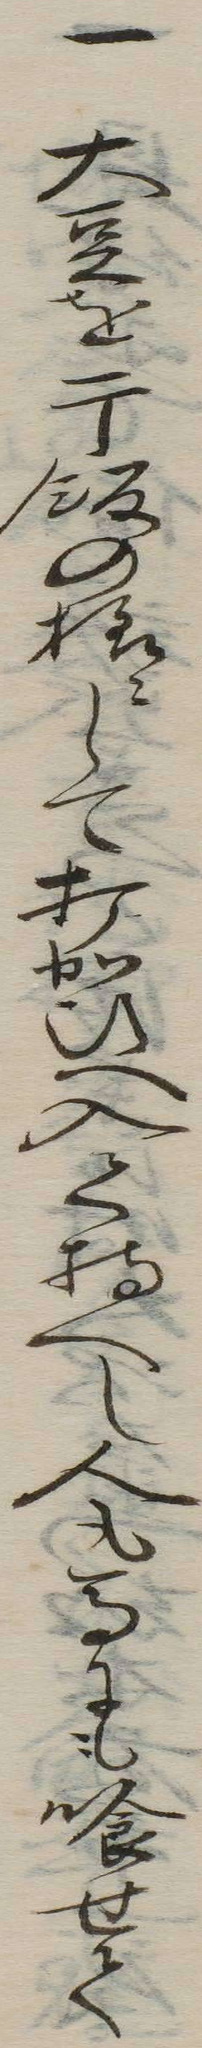一大豆を干飯の様ニして打かひへ入て持へし人も馬にも喰せて
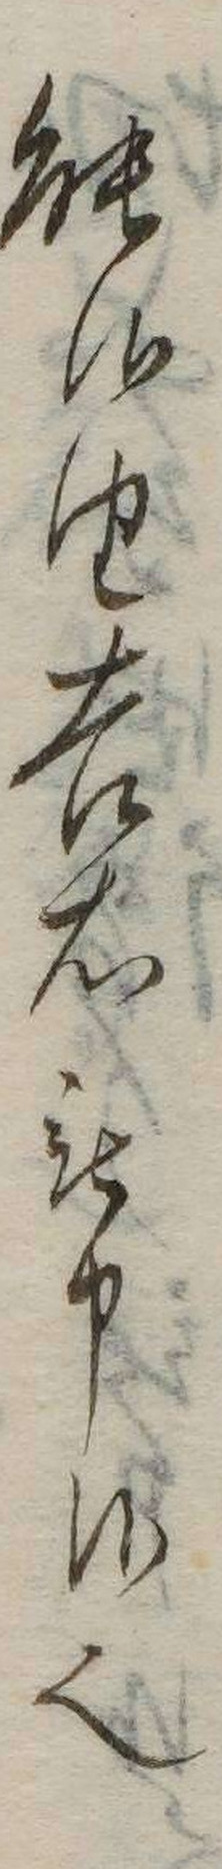能候由吉右被申候也
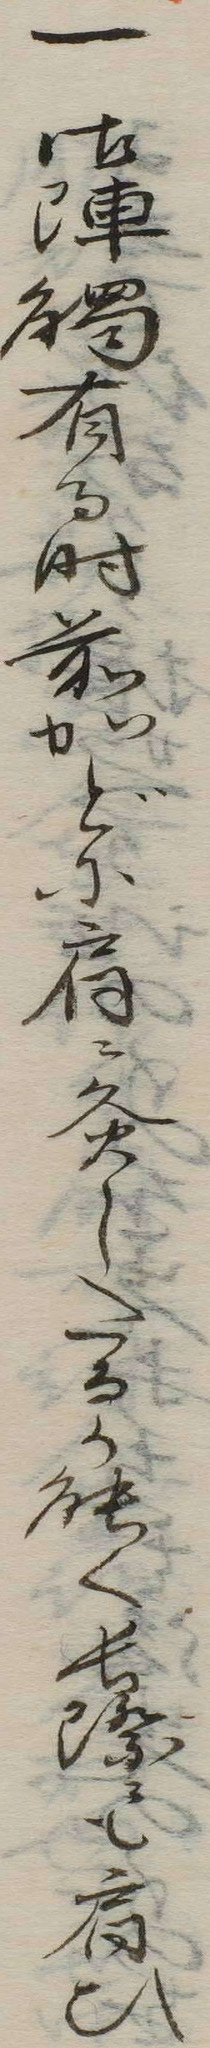一御陣触有る時前かどに肩ニ灸したるか能く長際ニも肩ひ
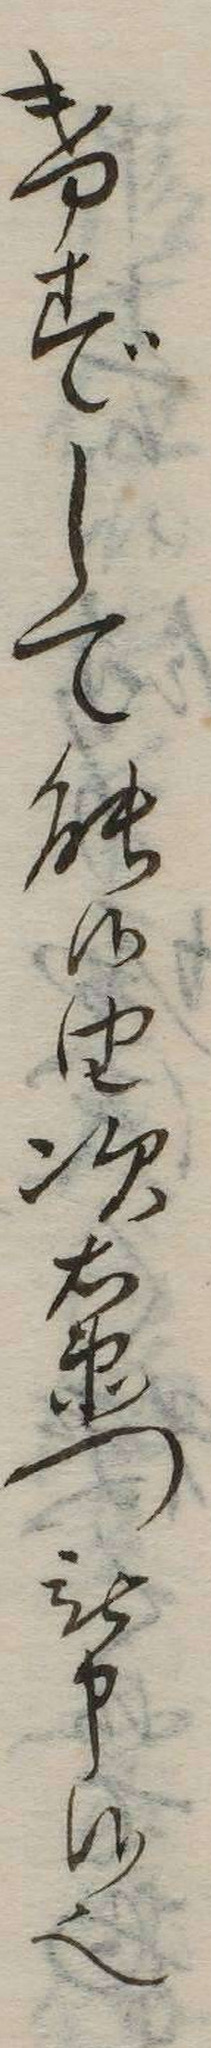けずして能候由次右衛門被申候也
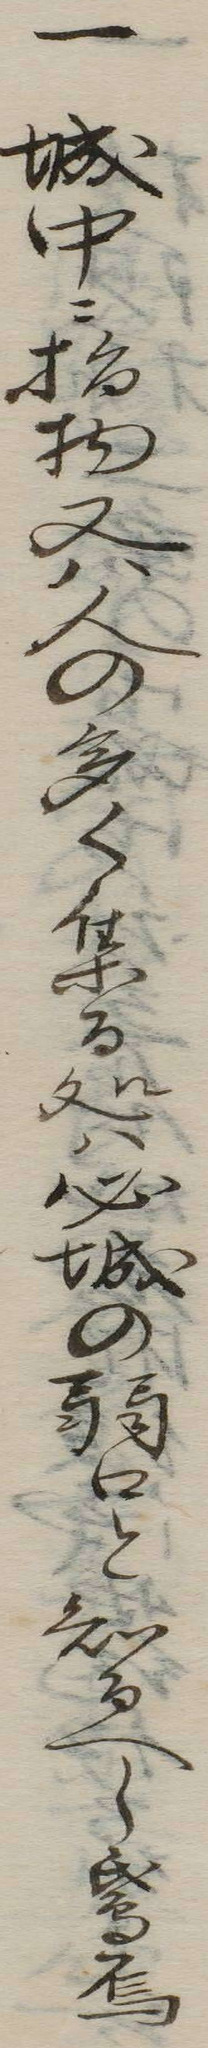一城中ニ指物又は人の多く集る処は必城の弱口と知るへし鴟烏
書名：三河之物語
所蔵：国文学研究資料館
